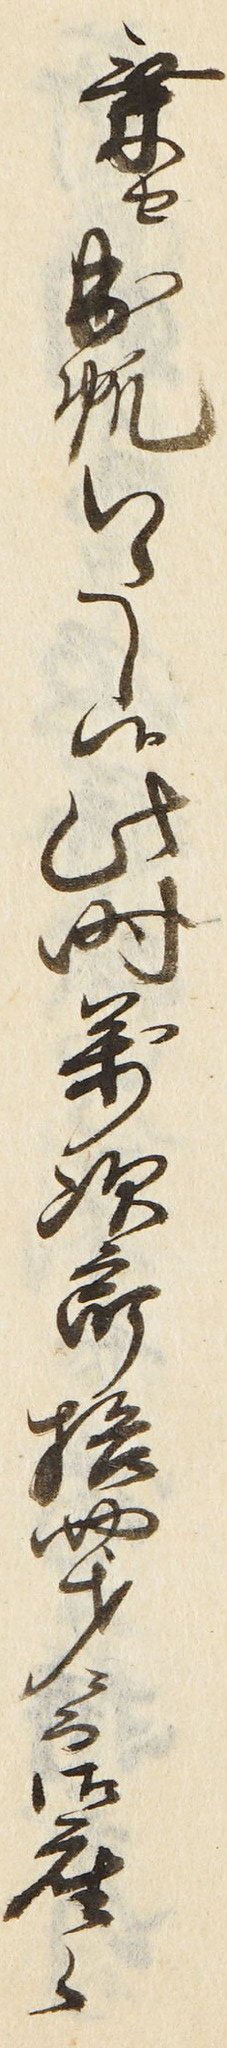乗セ出帆いたし候此時萬次郎拾四才ニ而御座候
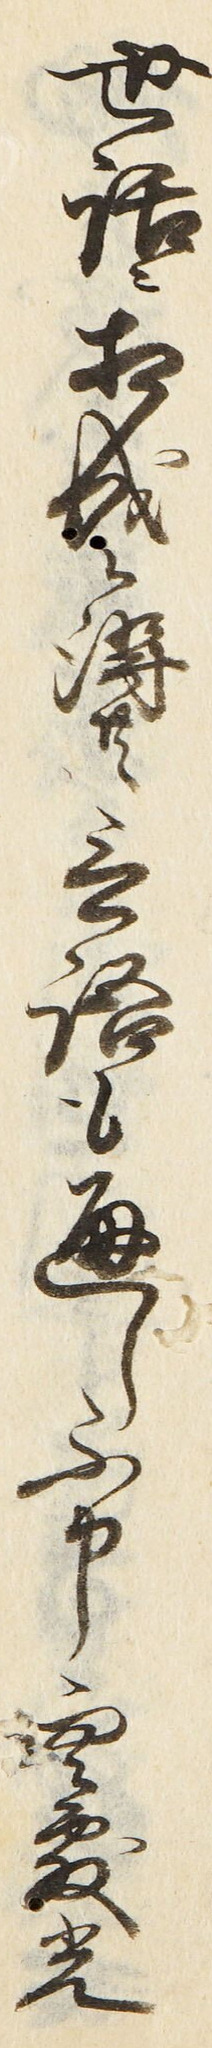世話ニ相成候得共言語も通不申空敷光
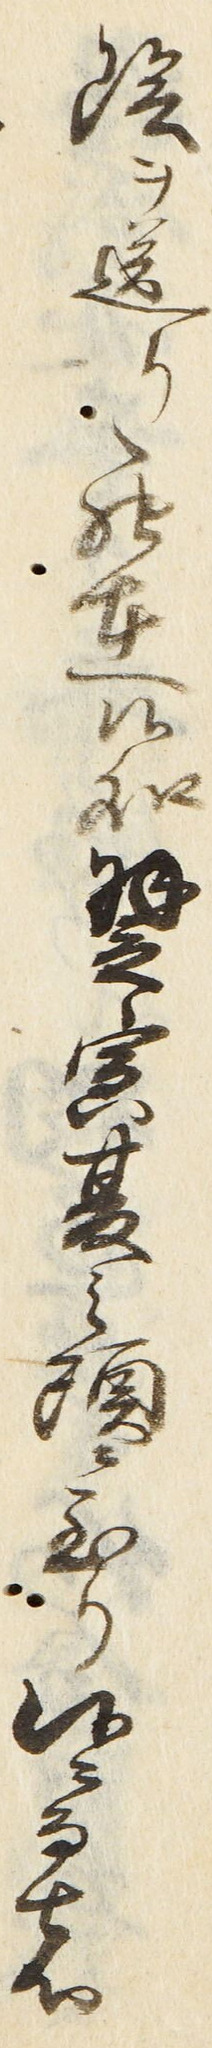陰ヲ送り罷在候処翌寅夏之頭ニ至り候ニ而者
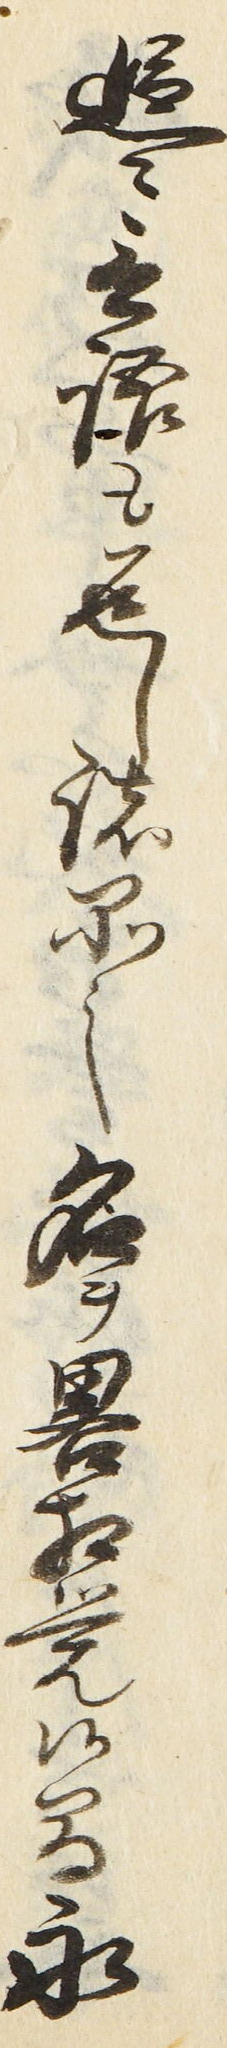追々言語も通し諸品之名ヲ畧相覚候間永
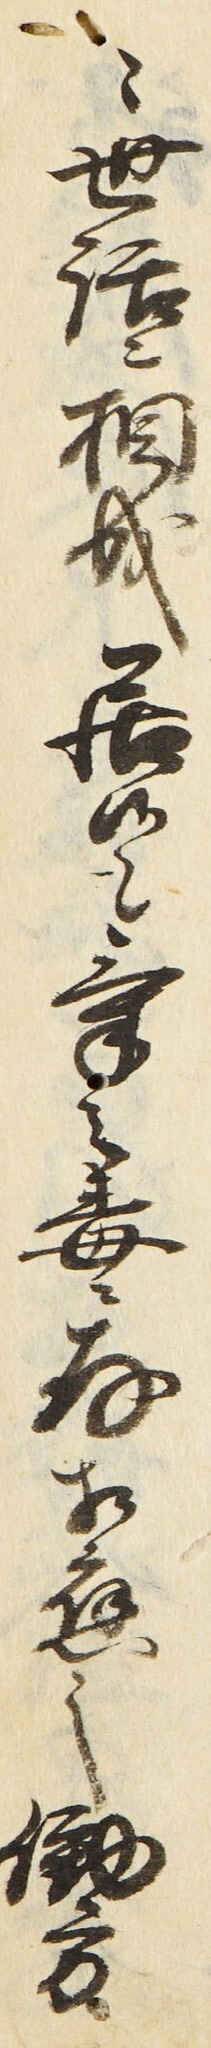々世話ニ相成居候も氣之毒ニ存相應之働方

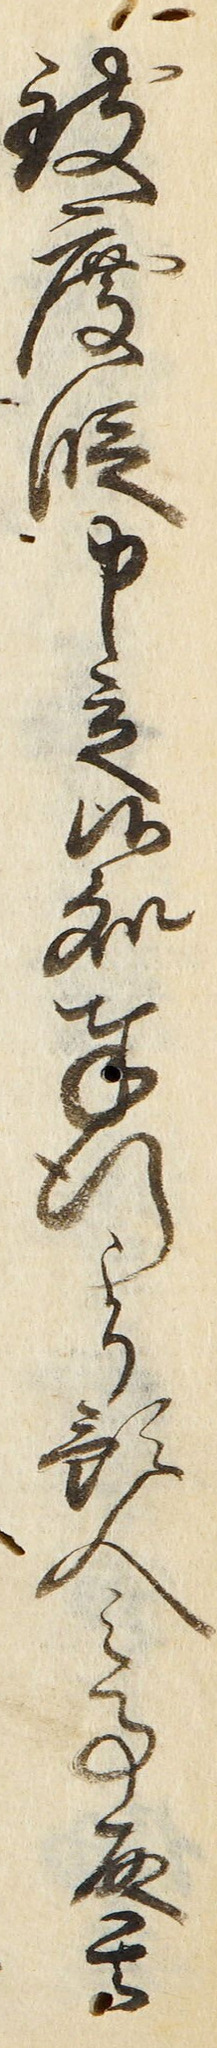致度段申立候処奉行より預人之事故其
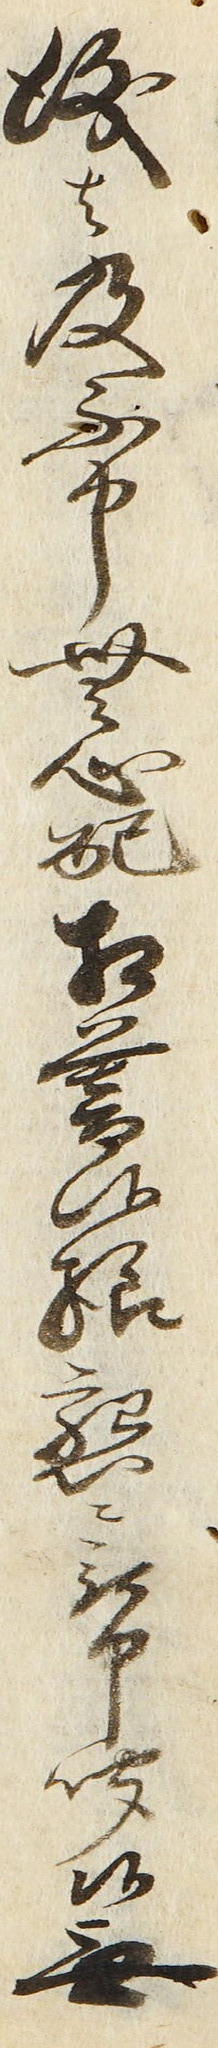儀者及不申無心配相暮候様懇ニ被申聞候無
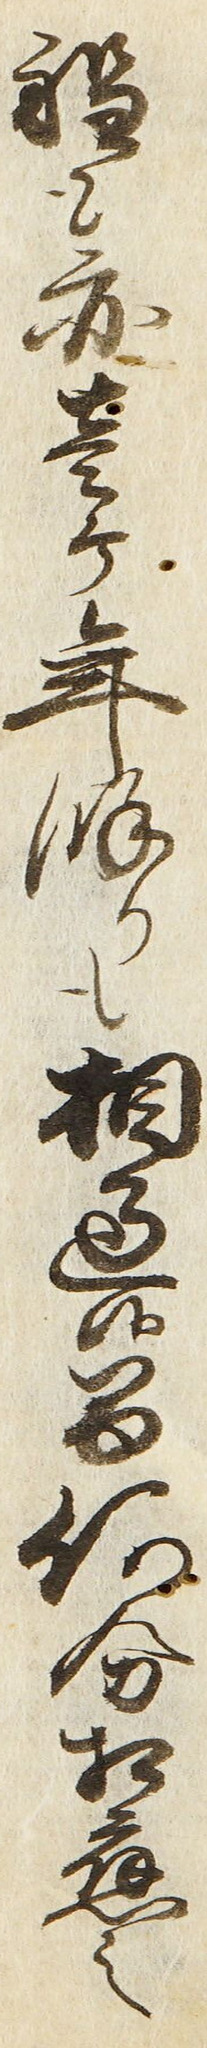程も亦壱ケ年餘りも相過候間何分相應之
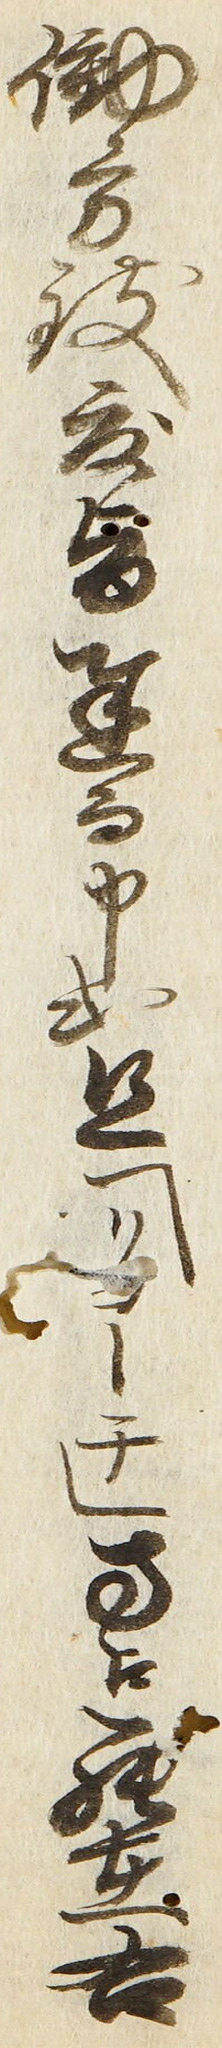働方致度旨達而申出且「リヨーチ」方江罷在右
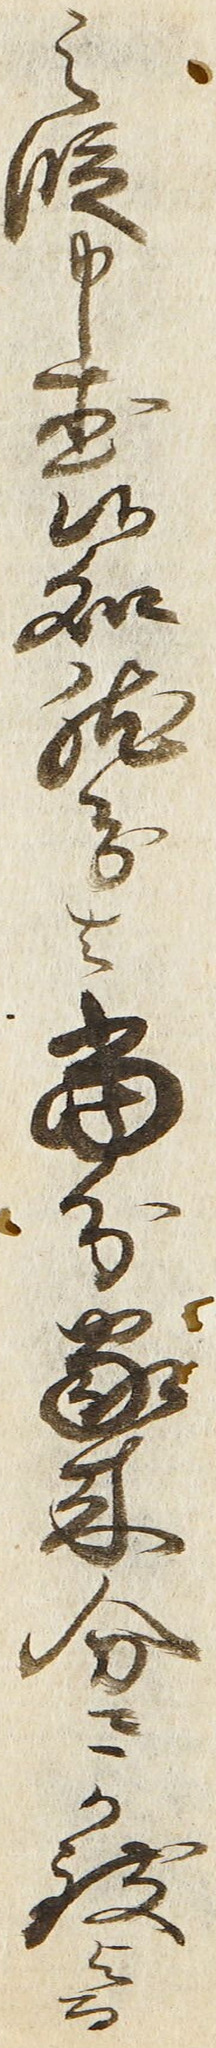之段申述候処然分者當分家来分ニ可致と而
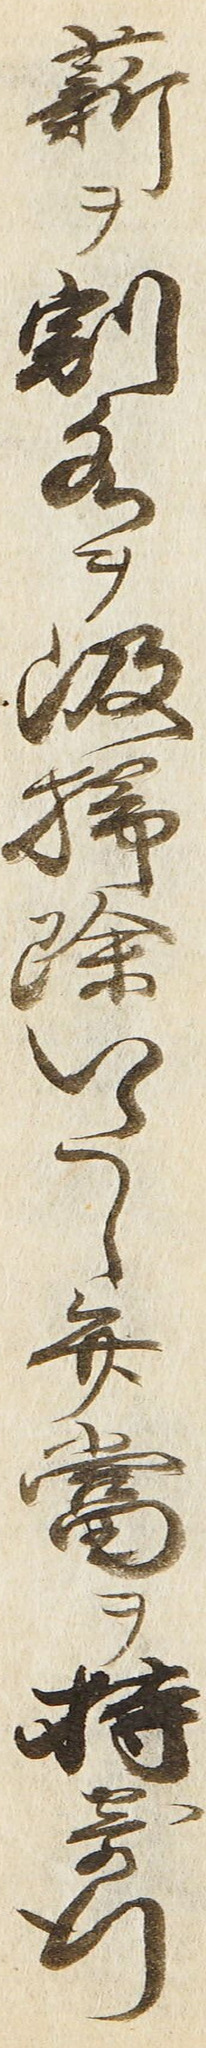薪ヲ割水ヲ汲掃除いたし弁當ヲ持寄行
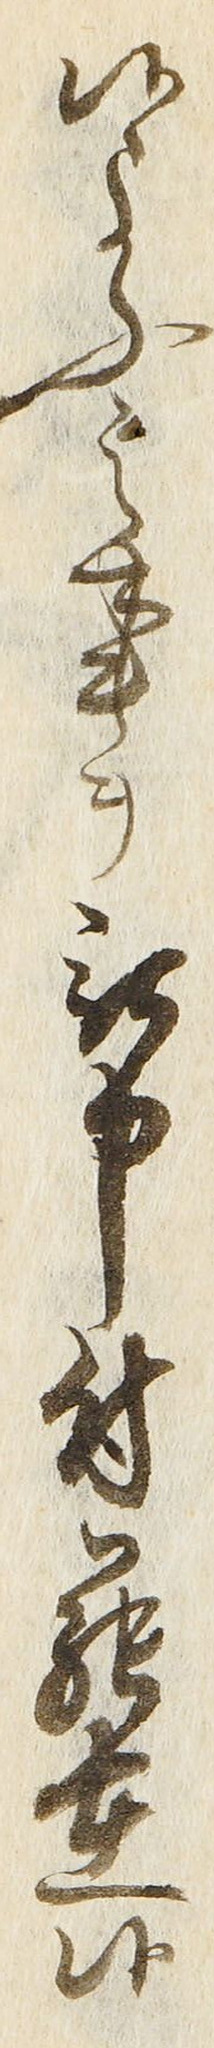候よふ之事ヲ被申付罷在候
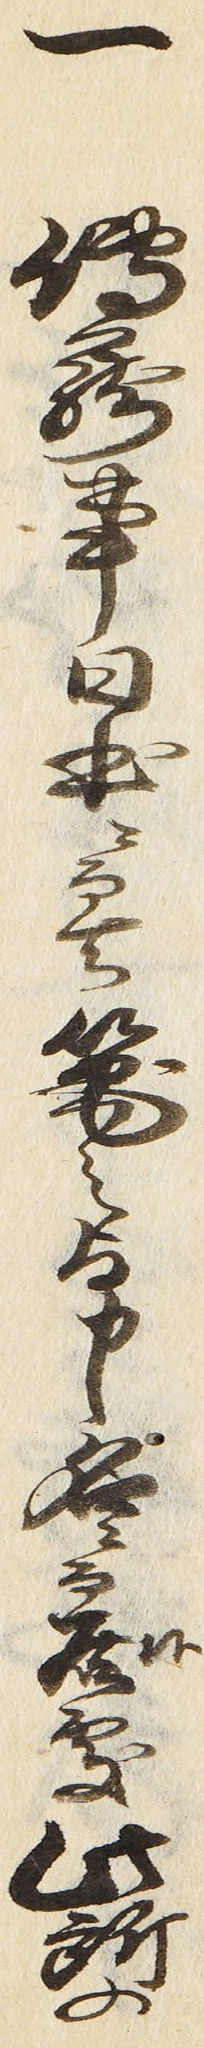一傳蔵事日本ニ而者筆之と申名ニ而候處此所の
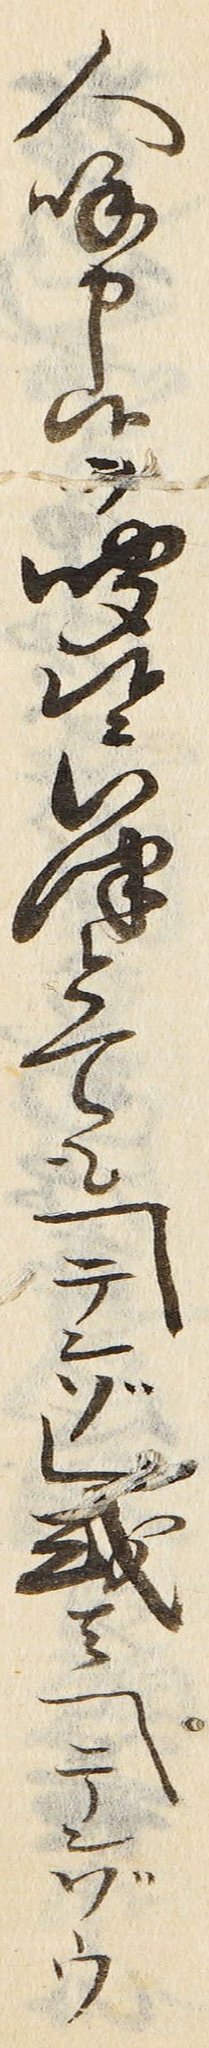人呼申候ヲ聞候ニいつとても「テンゾ」或者「テンゾウ
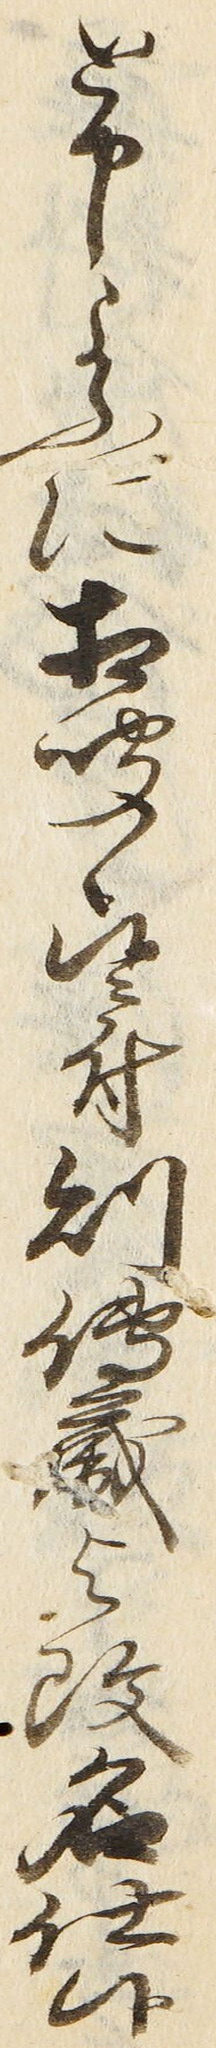と申よふに相聞候ニ付別傳蔵と改名仕候
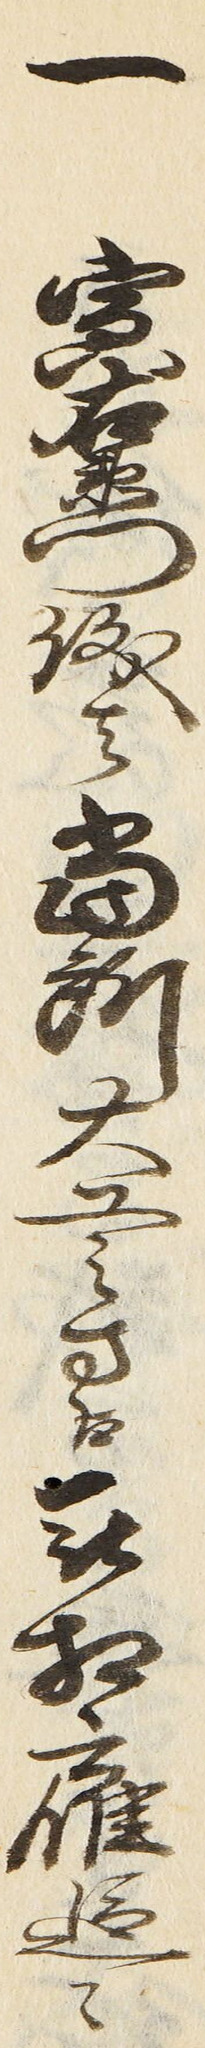一寅右衛門儀者當所大工之方江被相雇追々
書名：漂客談寄
